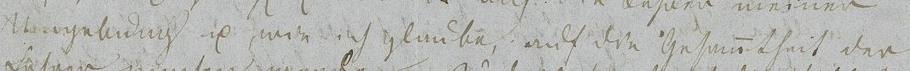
Umgebung u wie ich glaube, auf die Gesammtheit der
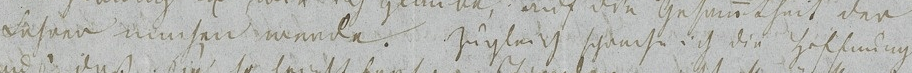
Lehrer machen werde. Zugleich spreche ich die Hoffnung
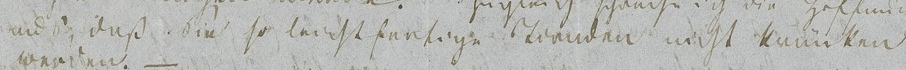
aus, daß Sie so leichtfertige Tiraden nicht kränken
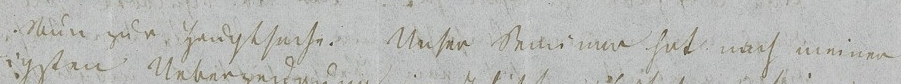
Nun zur Hauptsache: Unser Seminar hat nach meiner
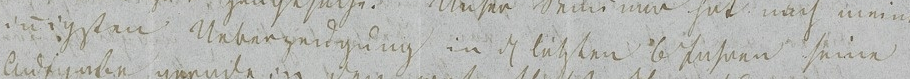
innigsten Ueberzeugung in den letzten 6 Jahren seine
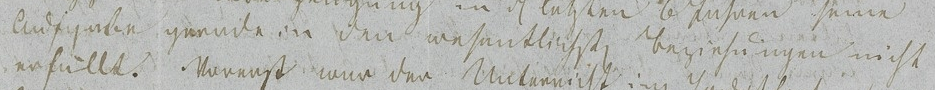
Aufgabe gerade in den wesentlichsten Beziehungen nicht
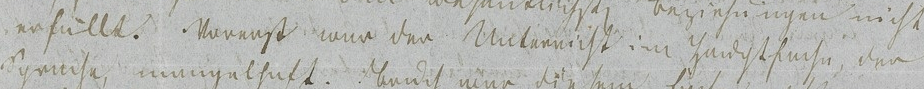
erfüllt. Vorerst war der Unterricht im Hauptfache, der
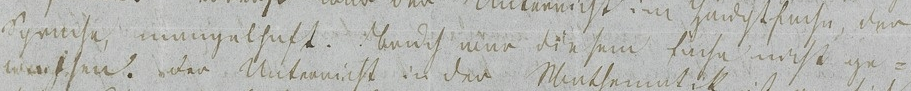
Sprache, mangelhaft. Bruch war diesem Fache nicht ge-
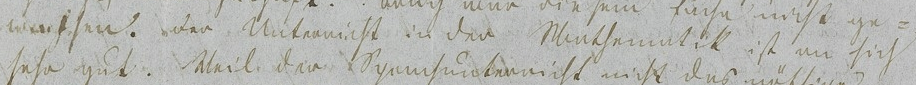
wachsen. Der Unterricht in der Mathematik ist an sich
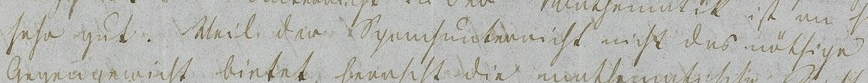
sehr gut. Weil der Sprachunterricht nicht das nöthige
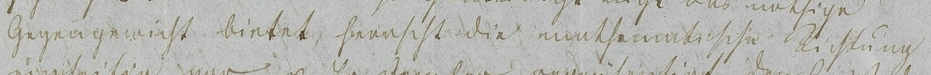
Gegengewicht bietet, herrscht die mathematische Richtung
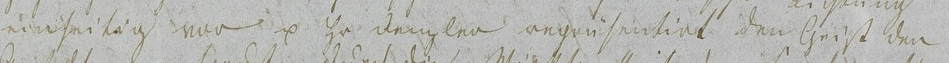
einseitig vor u Hr. Denzler repräsentirt den Geist der
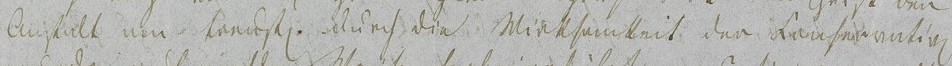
Anstalt am treusten. Durch die Wirksamkeit der Conservativen
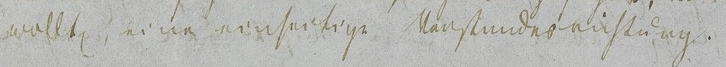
wollten, eine einseitige Verstandesrichtung.
